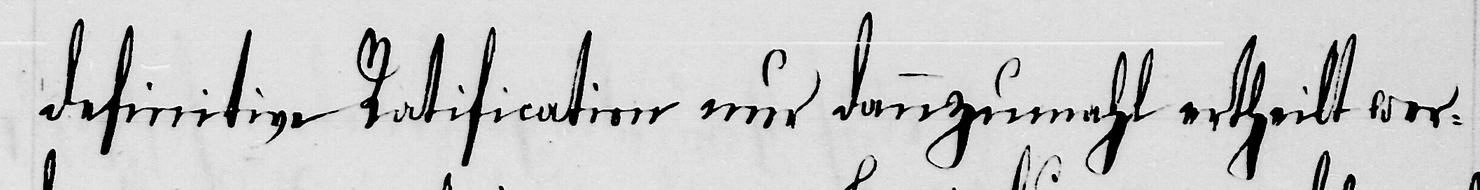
definitive Ratification nur dannzumahl ertheilt wer¬
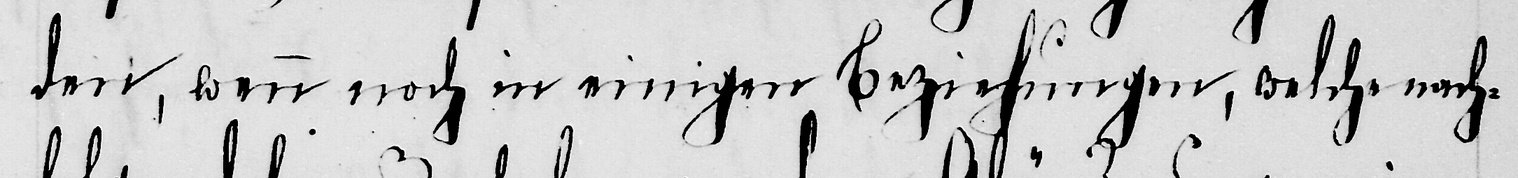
den, wenn noch in einigen Beziehungen, welche nach¬
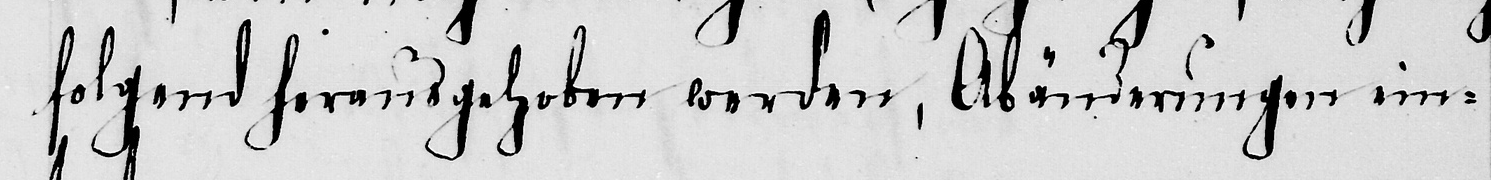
folgend herausgehoben werden, Abänderungen ein¬
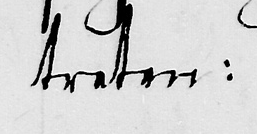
treten:
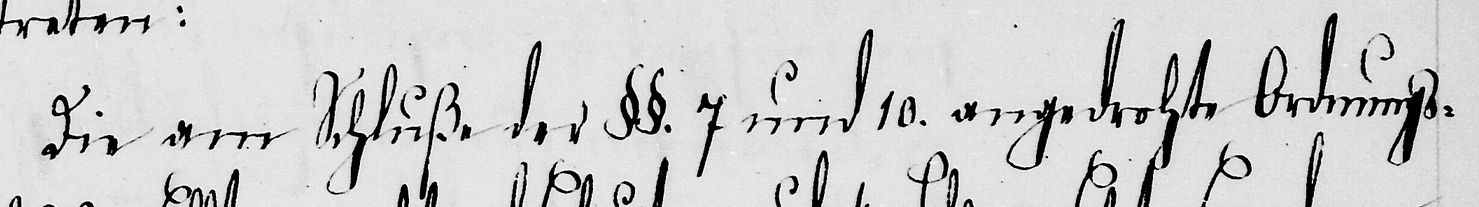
Die am Schluße der §§. 7. und 10. angedrohte Ordnungs¬
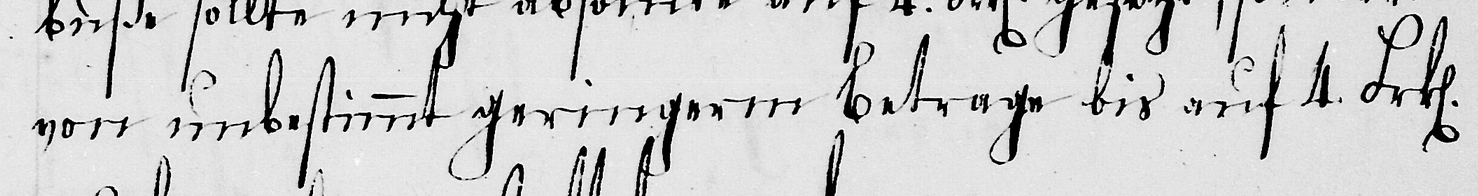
von unbestimmt geringerm Betrage bis auf 4. Frk[e¬
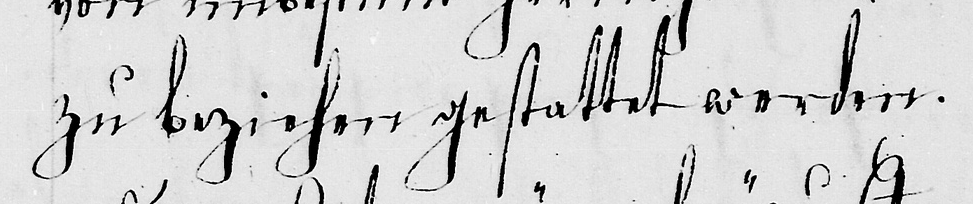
zu beziehen gestattet werden.
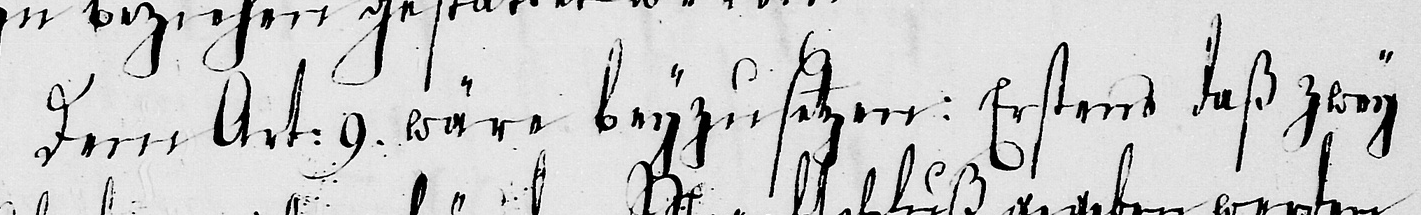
Dem Art: 9. wäre beyzusetzen: Erstens daß zwey
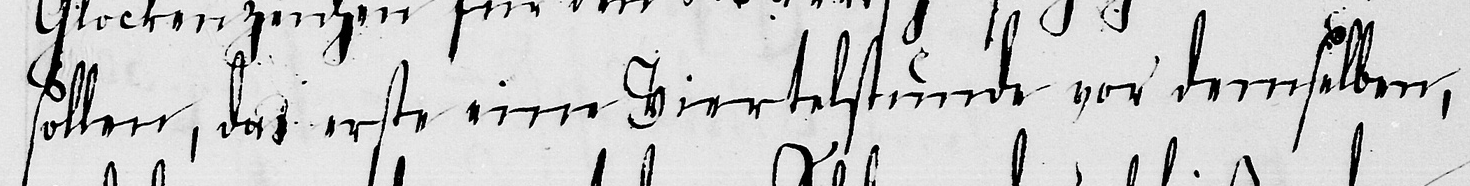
sollen, das erste eine Viertelstunde vor demselben,
